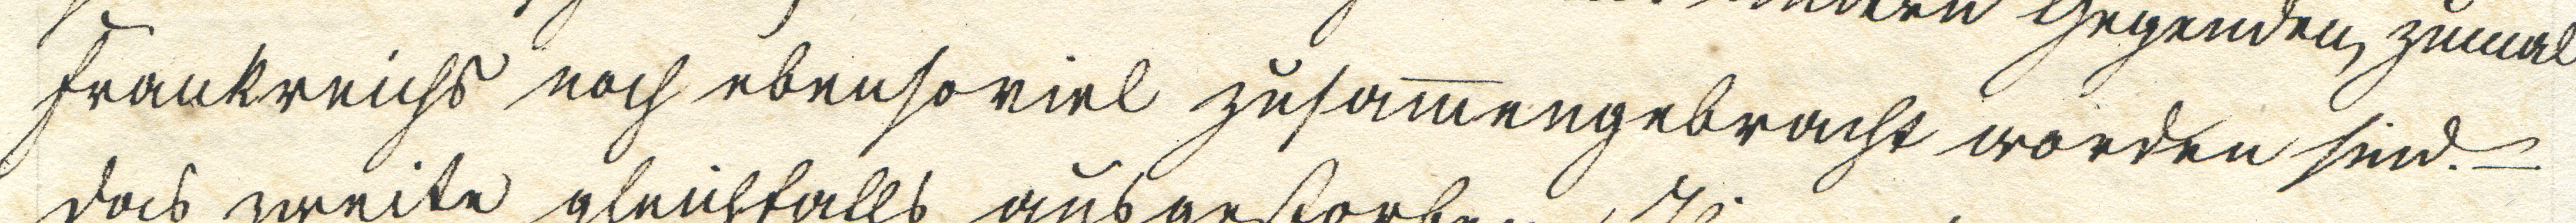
Frankreichs, noch ebensoviel zusam̃engebracht worden sind. –
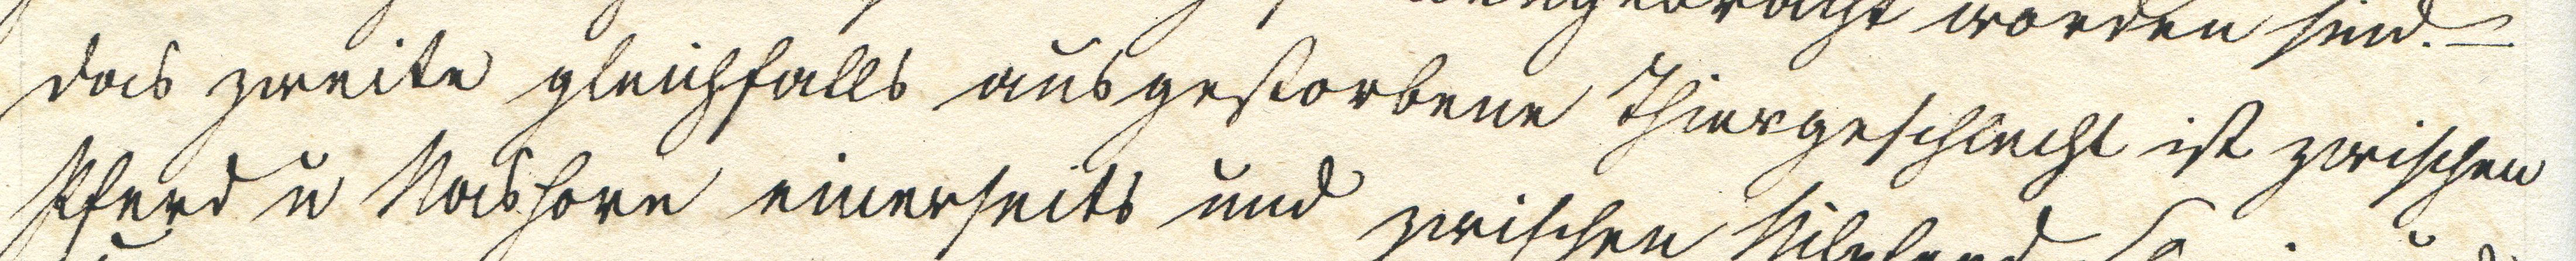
Das zweite gleichfalls ausgestorbene Thiergeschlecht ist zwischen
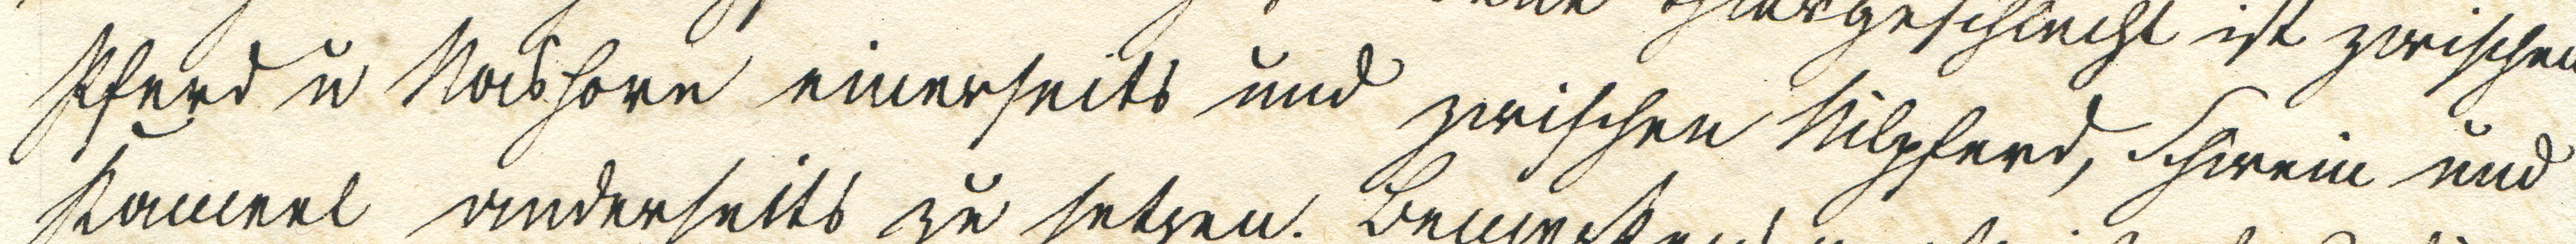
Pferd u Nashorn einerseits und zwischen Nilpferd, Schwein und
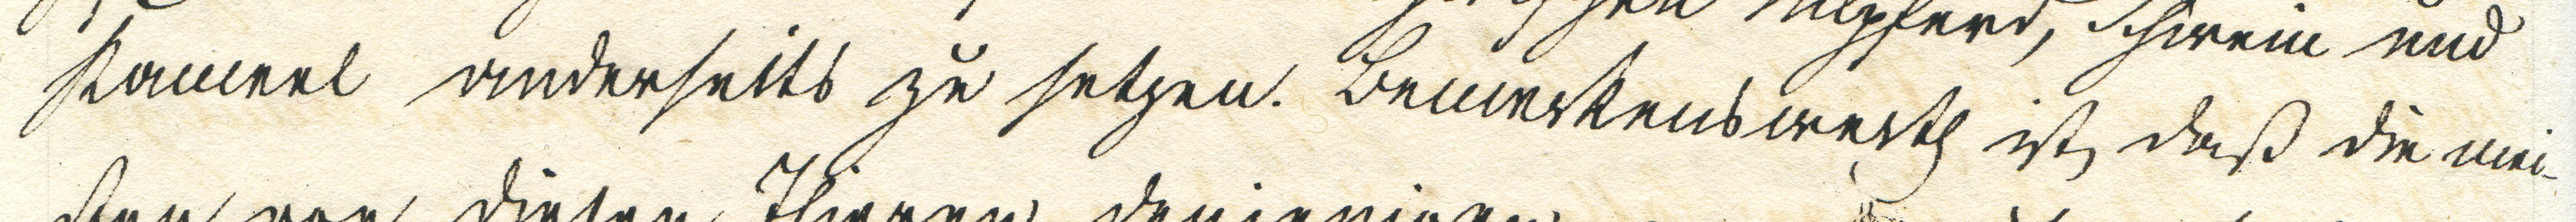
Kameel anderseits zu setzen. Bemerkenswerth ist, daß die mei-
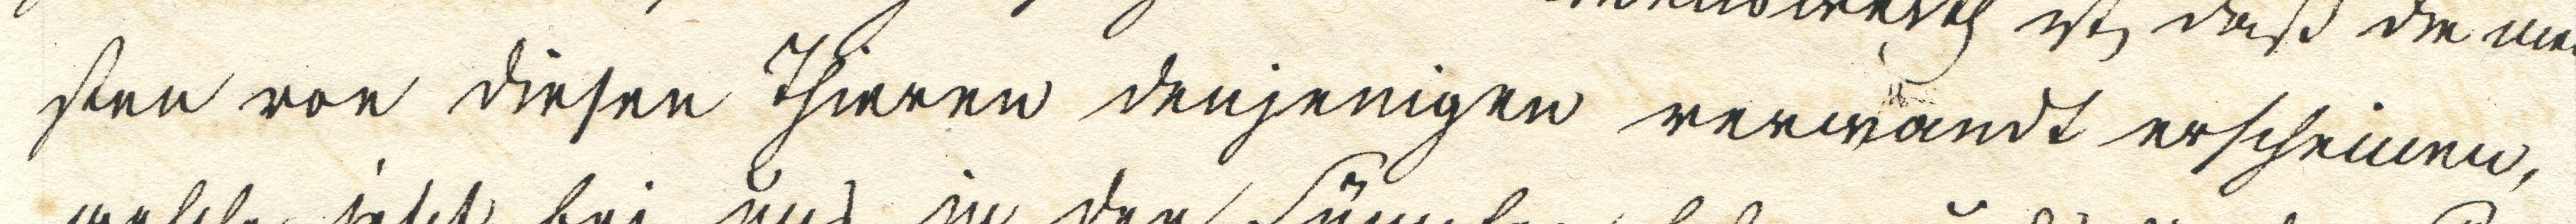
sten von diesen Thieren denjenigen verwandt erscheinen,
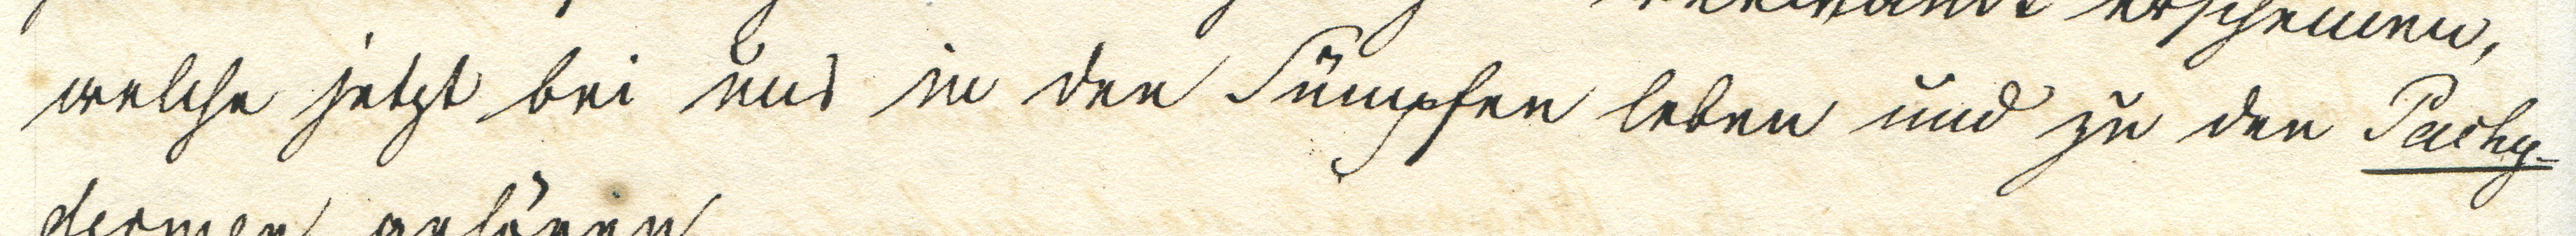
welche jetzt bei uns in den Sümpfen leben und zu den Pachy-
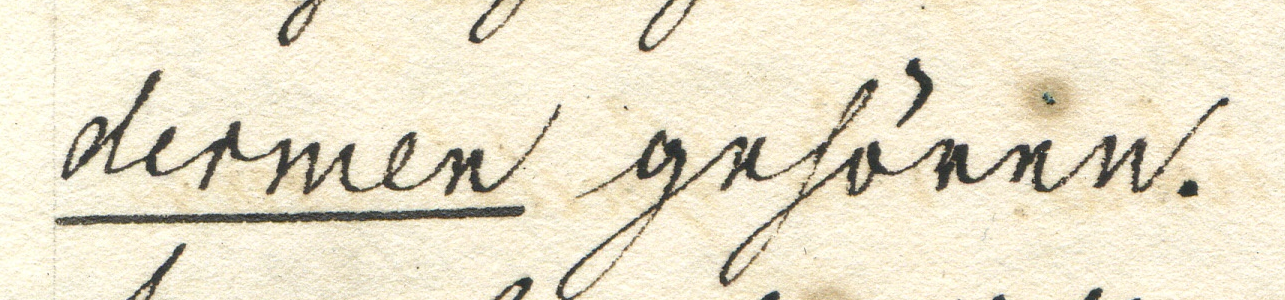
dermen gehören.
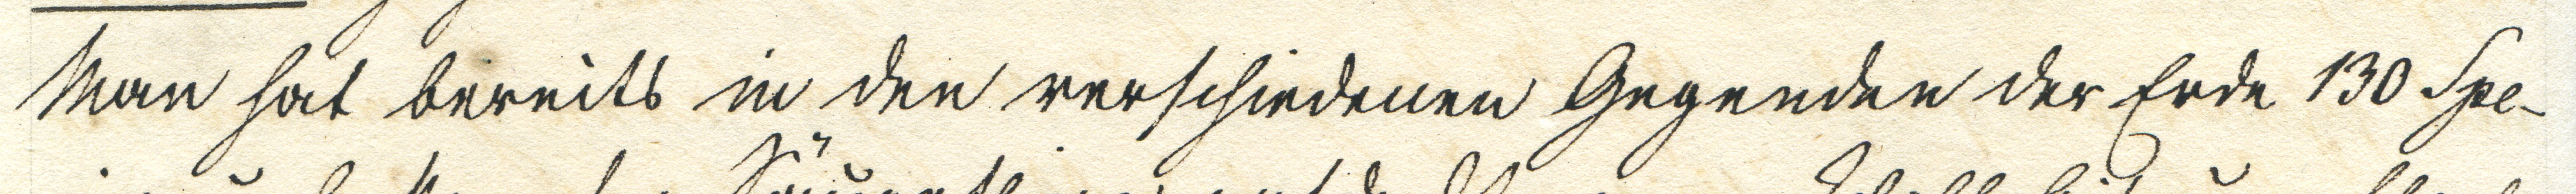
Man hat bereits in den verschiedenen Gegenden der Erde 130 Spe-
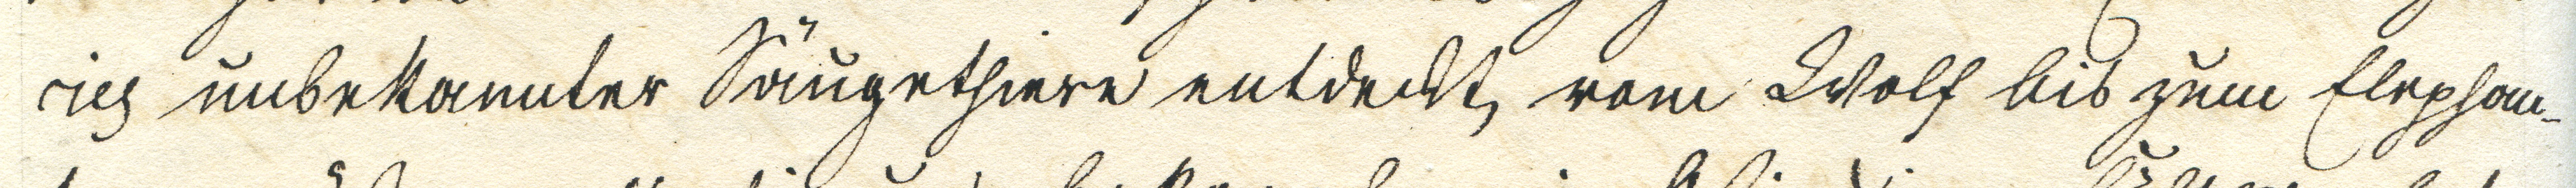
cies unbekannter Säugethiere entdeckt, vom Wolf bis zum Elephan-
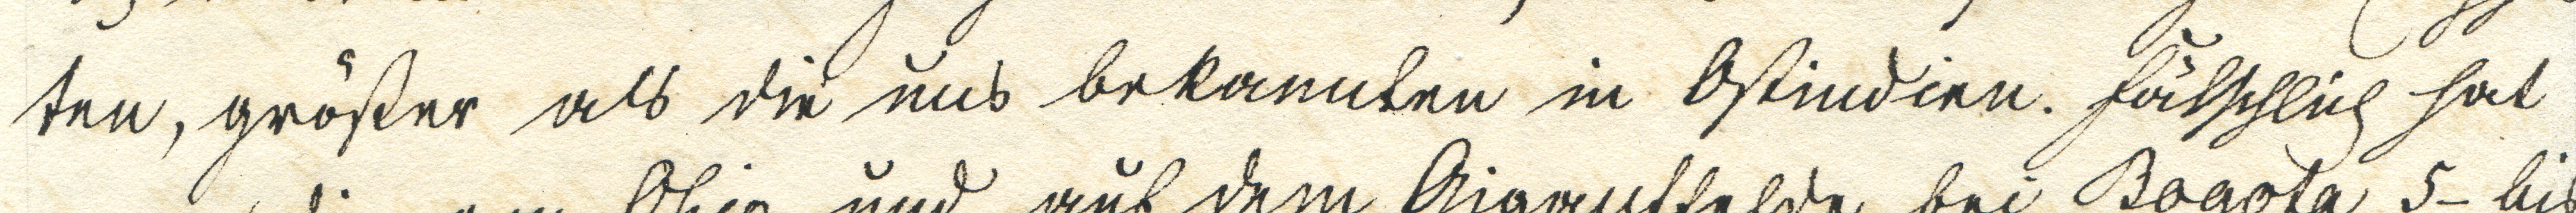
ten, größer als die uns bekannten in Ostindien. Fälschlich hat
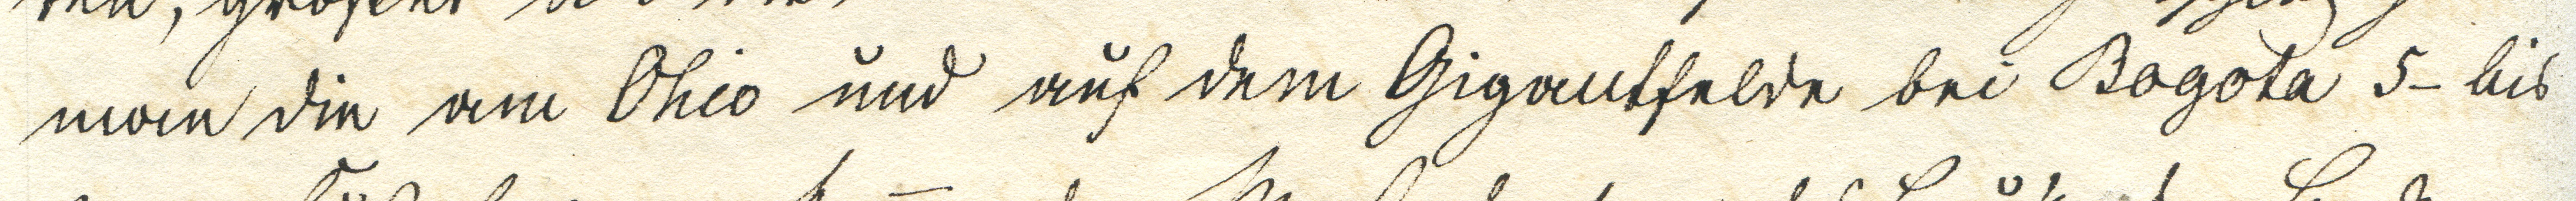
man die am Ohio und auf dem Gigantfelde bei Bogota, 5– bis
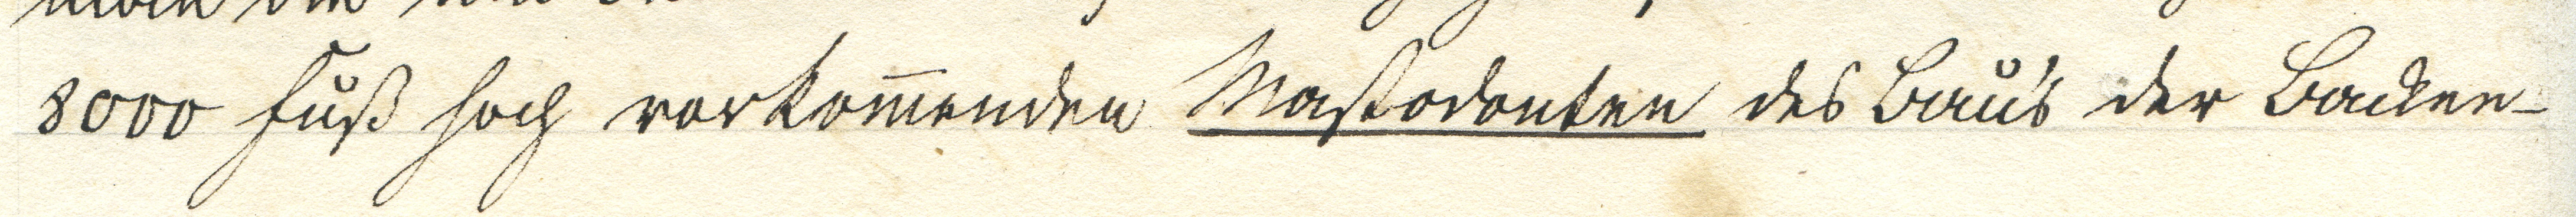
8000 Fuß hoch vorkom̃enden Mastodonten, des Bau’s der Backen-
